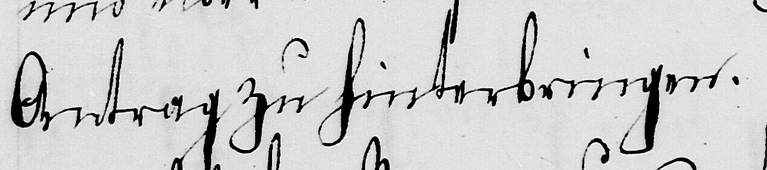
Antrag zu hinterbringen.
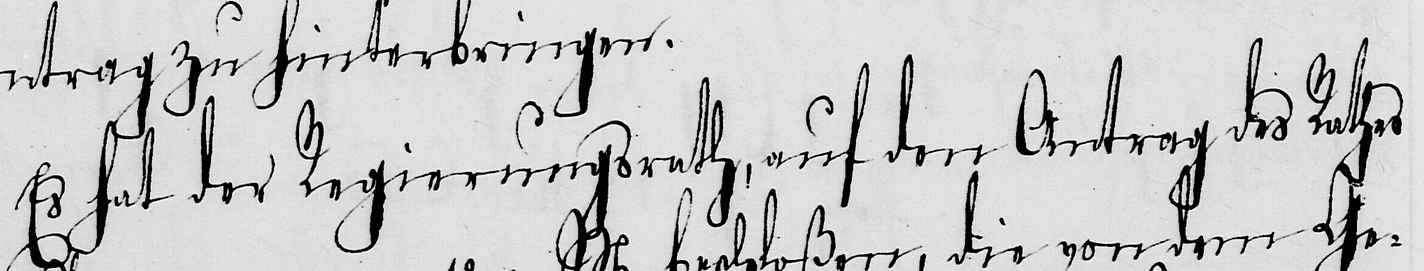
Es hat der Regierungsrath, auf den Antrag des Rath¬
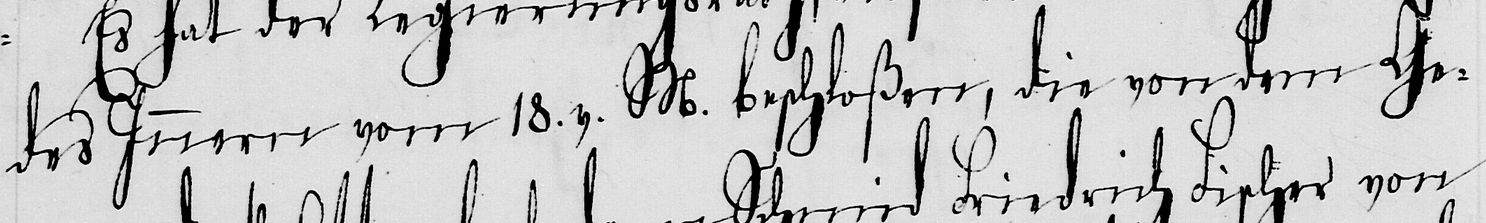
des Innern vom 18. v. M. beschloßen, die von dem Ge¬
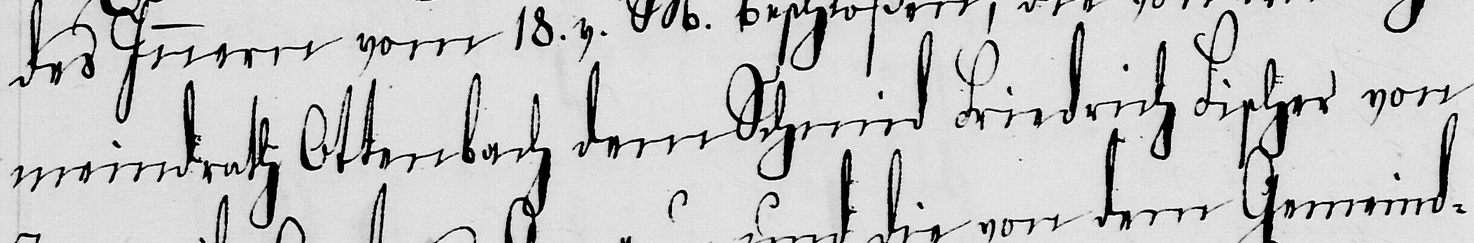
meindrath Ottenbach dem Schmid Friedrich Fischer von
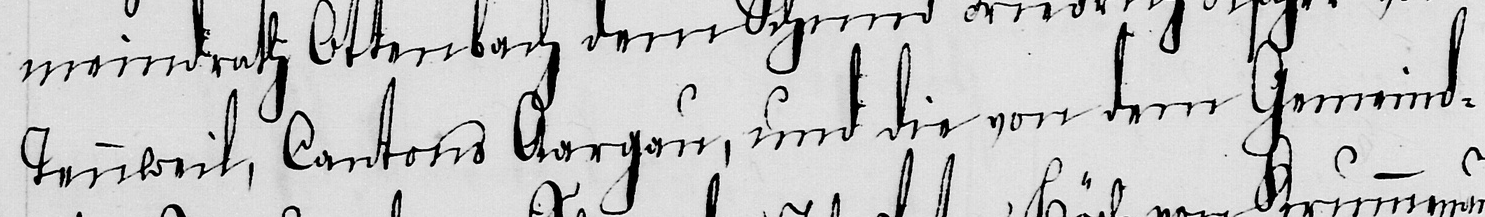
Tennweil, Cantons Aargau, und die von dem Gemeind¬
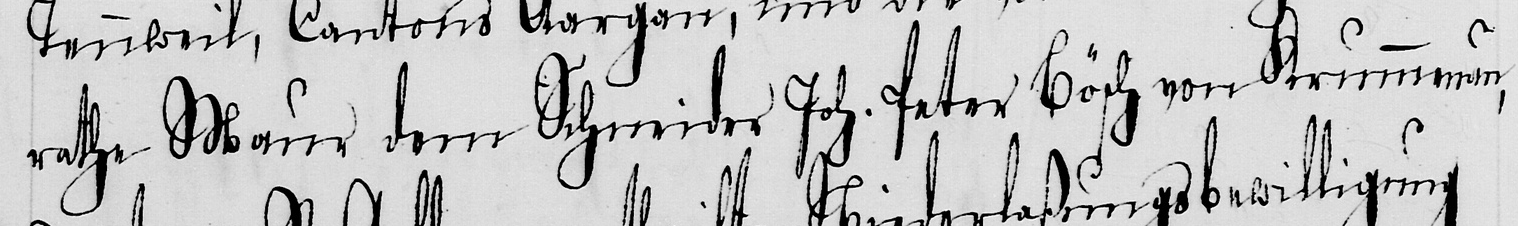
rathe Maur dem Schneider Joh. Peter Bösch von Krummenau,
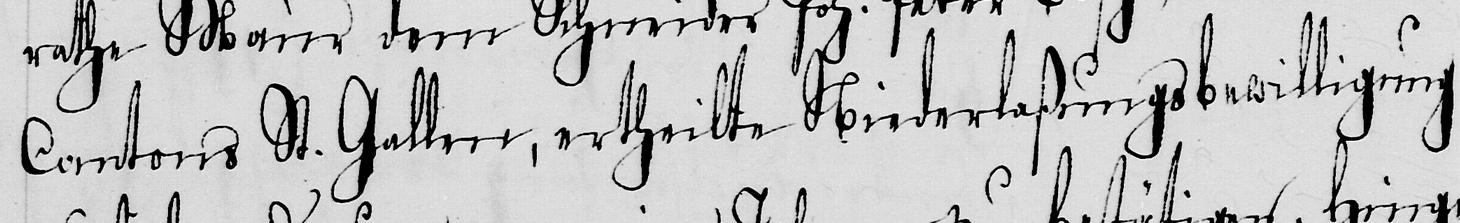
Cantons St. Gallen, ertheilte Niederlaßungsbewilligung
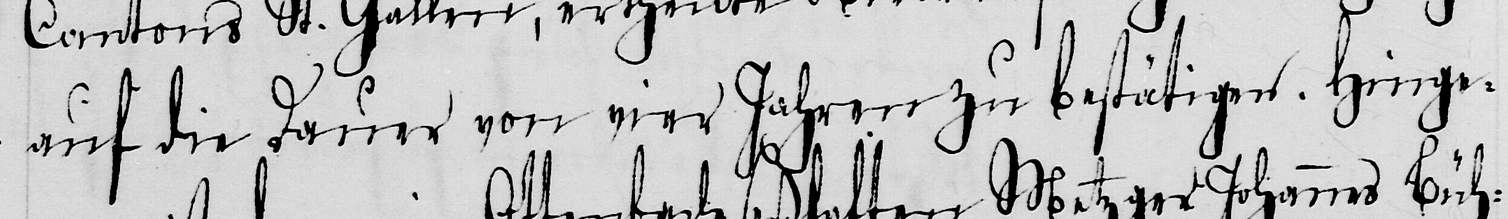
auf die Dauer von vier Jahren zu bestätigen. Hinge¬
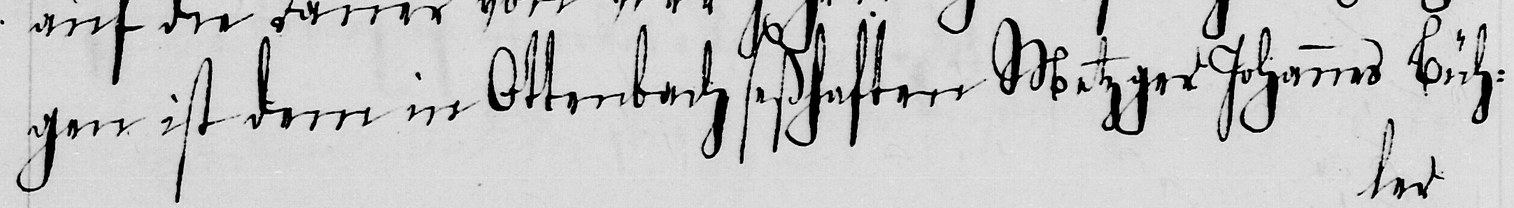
gen ist dem in Ottenbach seßhaften Metzger Johannes Büh-
